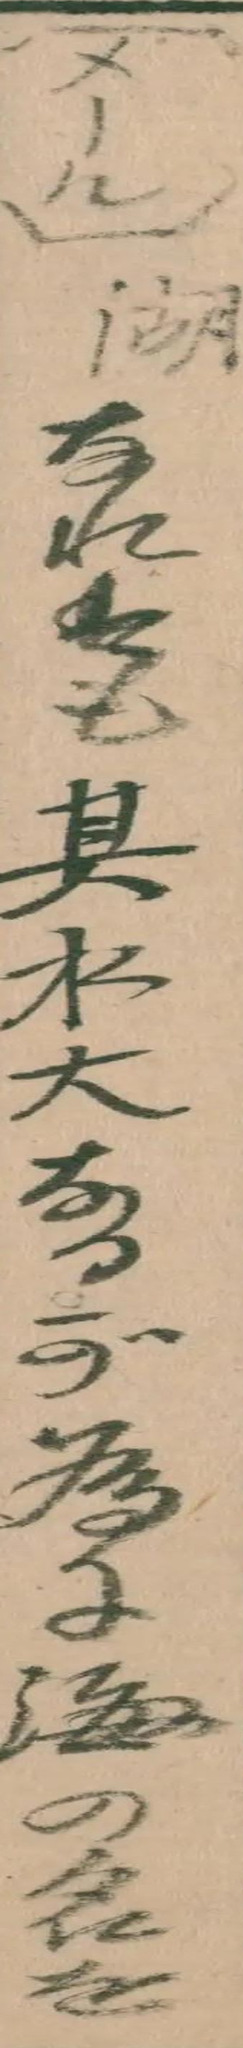(メール)湖なれとも其水大なるが為に海の名を
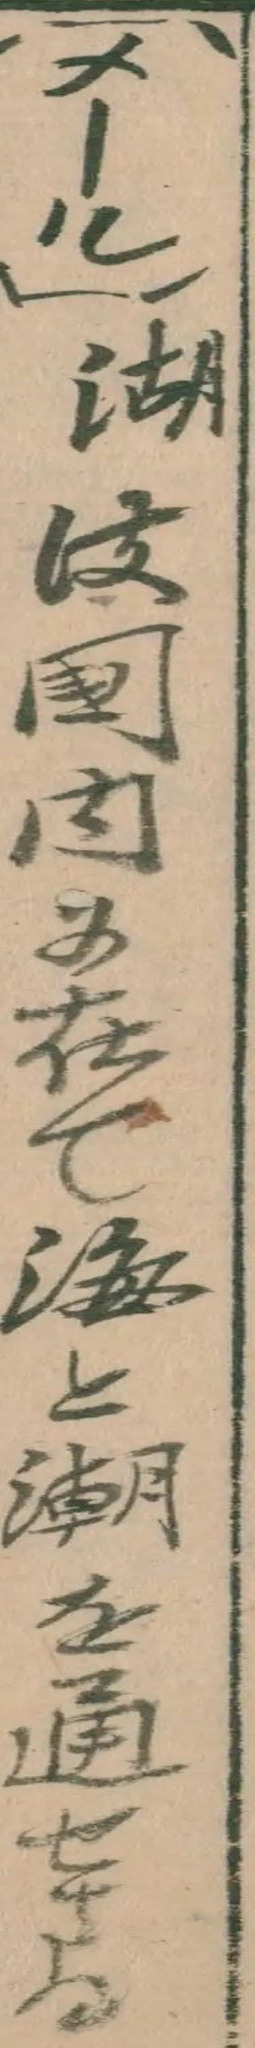(メール)湖は国内に在て海と潮を通せさる
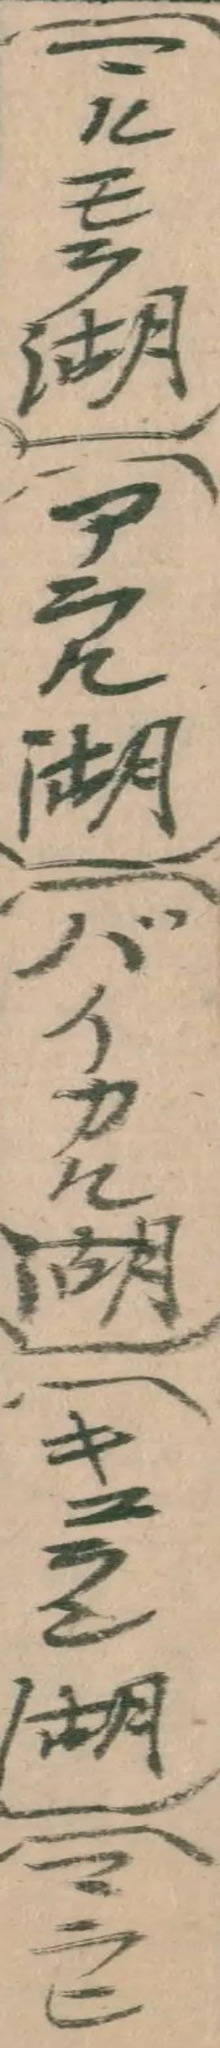(マルモラ湖)(アラル湖)(バイカル湖)(キュラン湖)(マラヒ
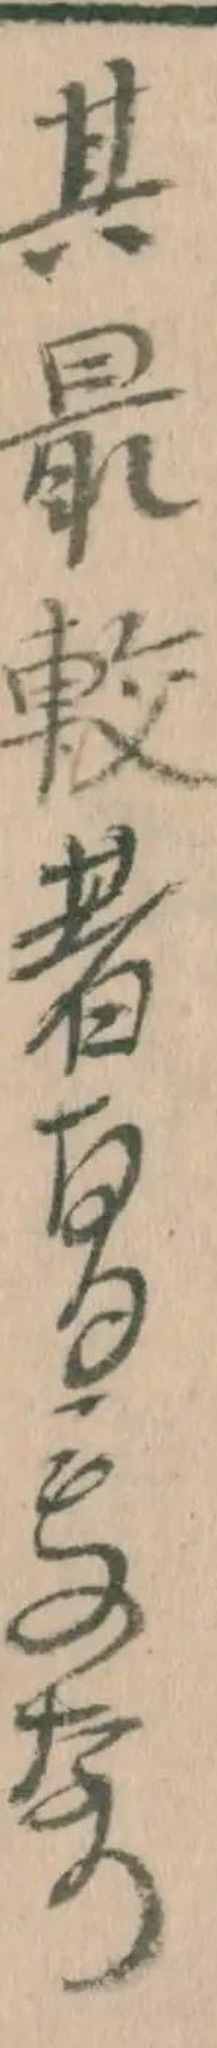其最較著なるものなり
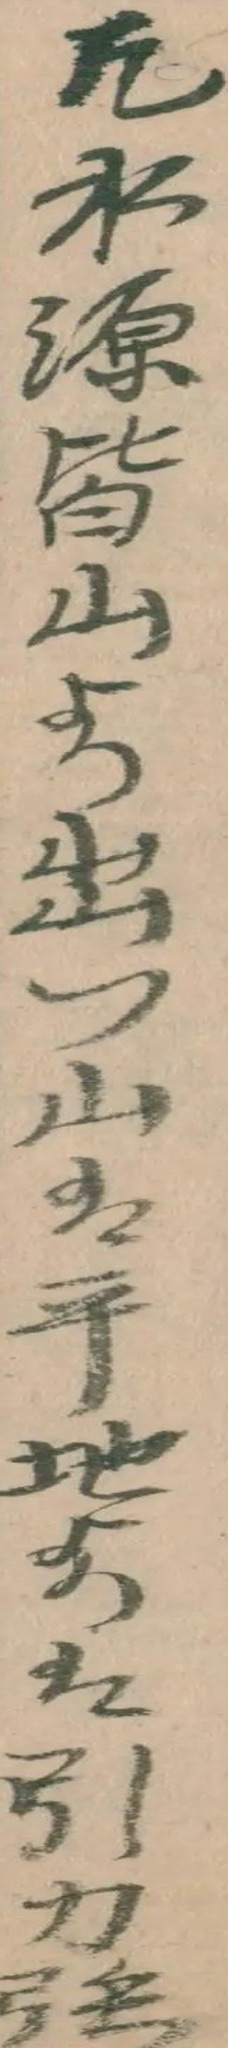凡水源皆山より出つ山は平地よりは引力強

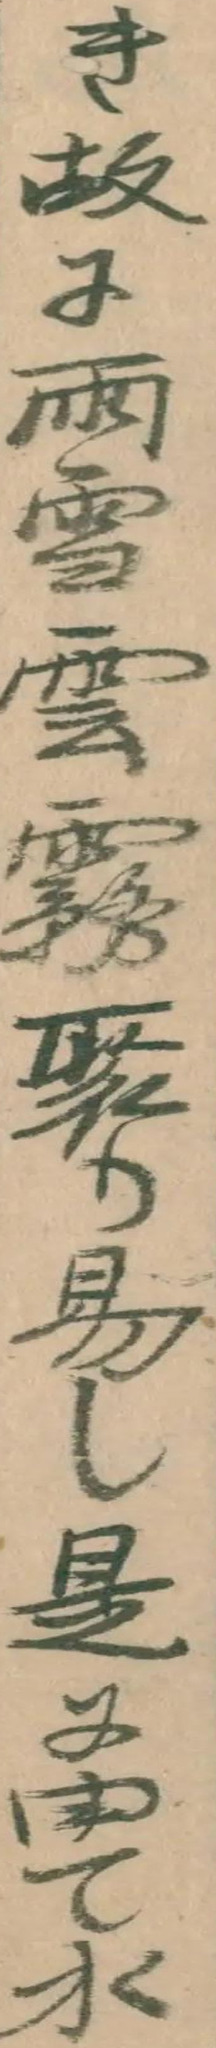き故に雨雪雲霧聚り易し是に由て水
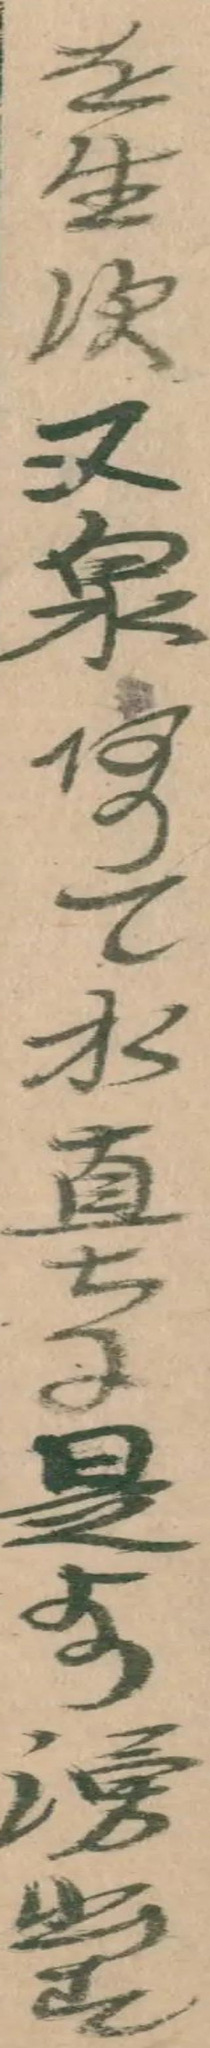を生す又泉ありて水直ちに是より湧出す
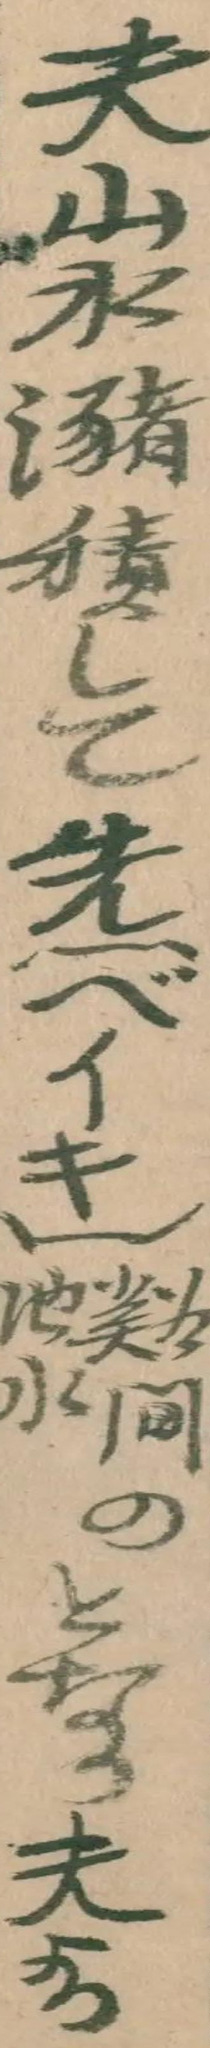夫山水潴積して先(ベイキ)谿間の池水となり夫より
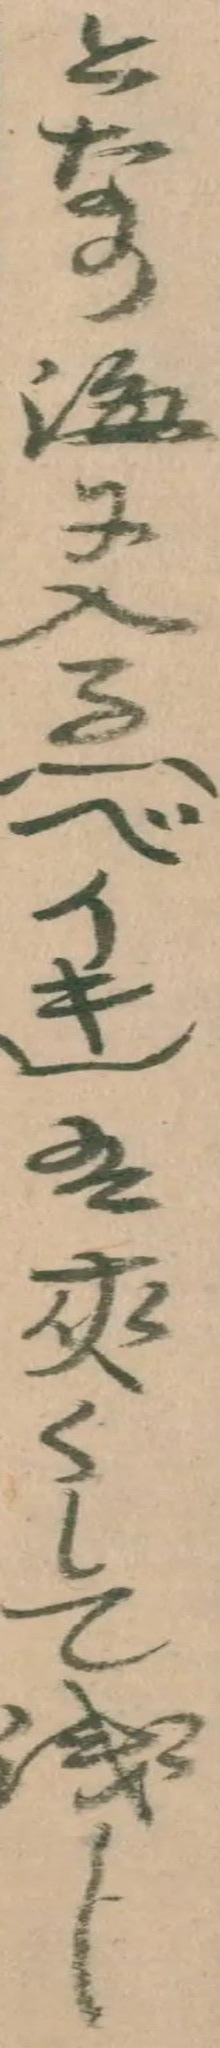となり海に入る(ベイキ)は夾くして浅し
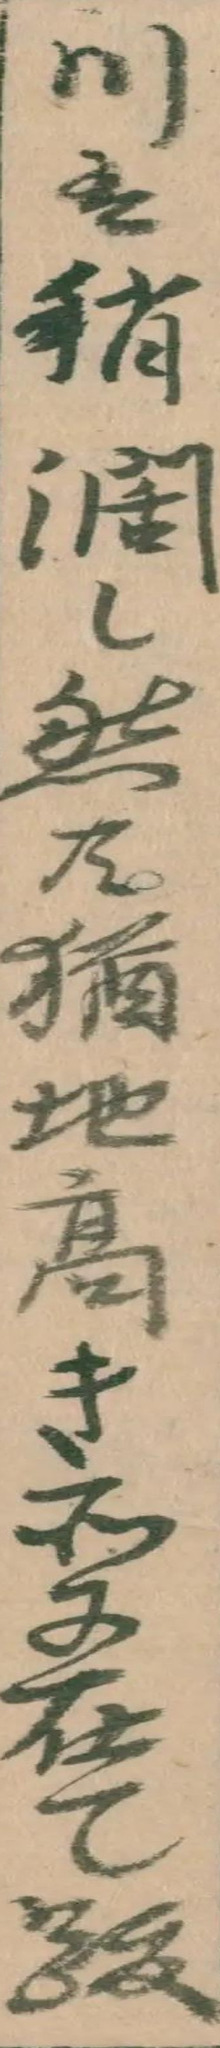川は稍濶し然共猶地高き所に在て跋
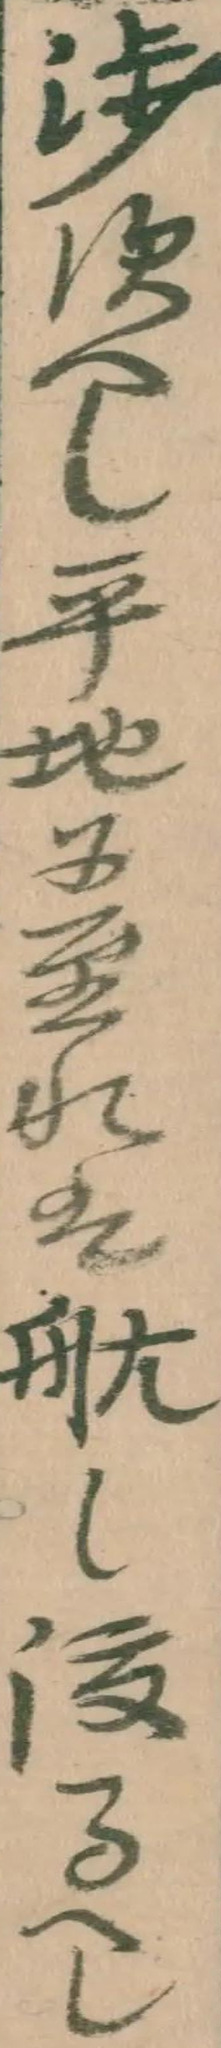渉すへし平地に至れは航し渡るへし
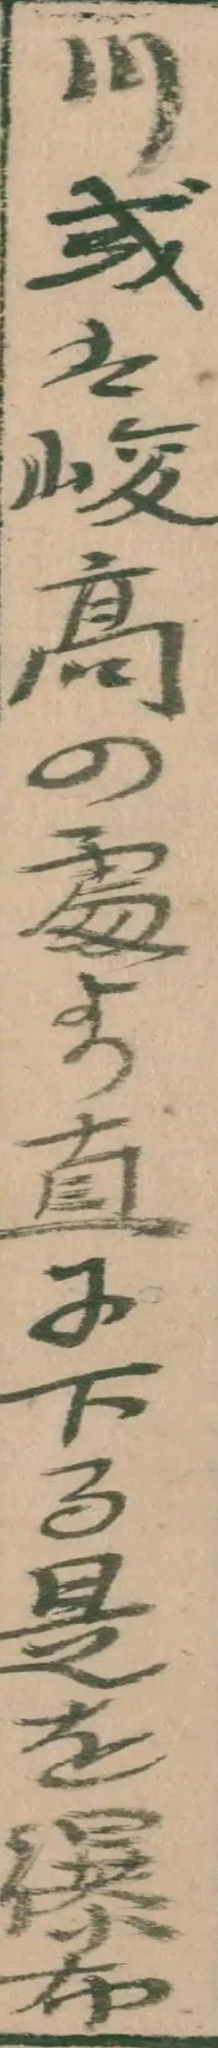川或は峻高の処より直に下る是を瀑布
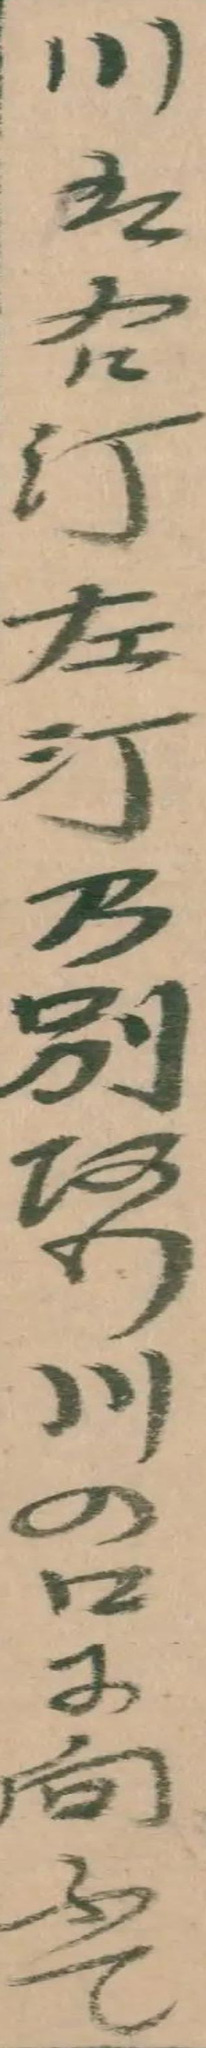川は右汀左汀の別あり川の口に向ふて
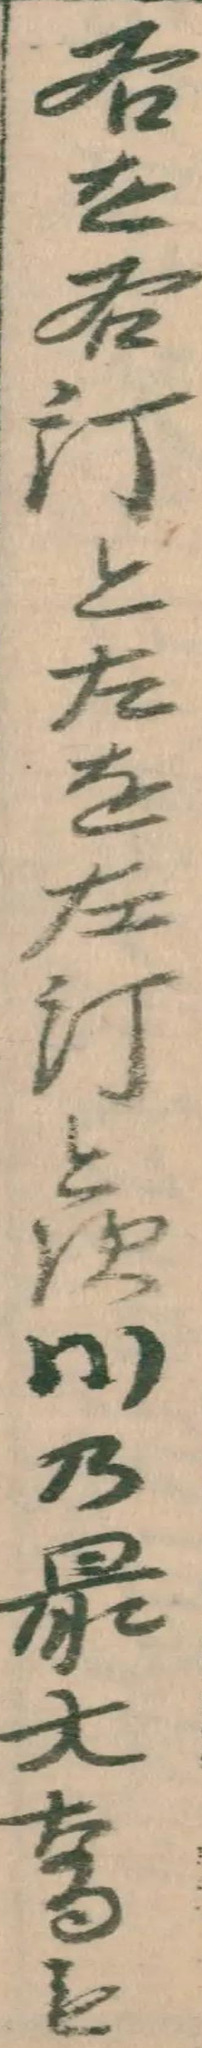右を右汀と左を左汀とす川の最大なるも
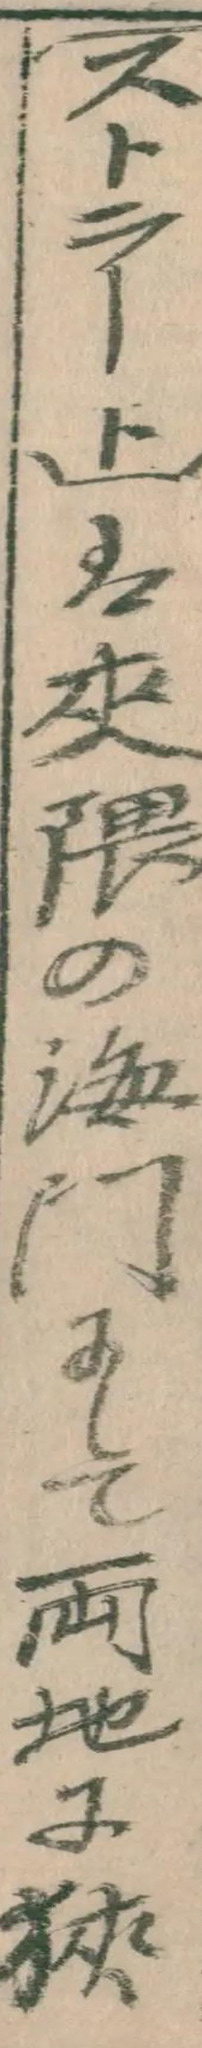(ストラート)は夾隈の海門にして両地に狭
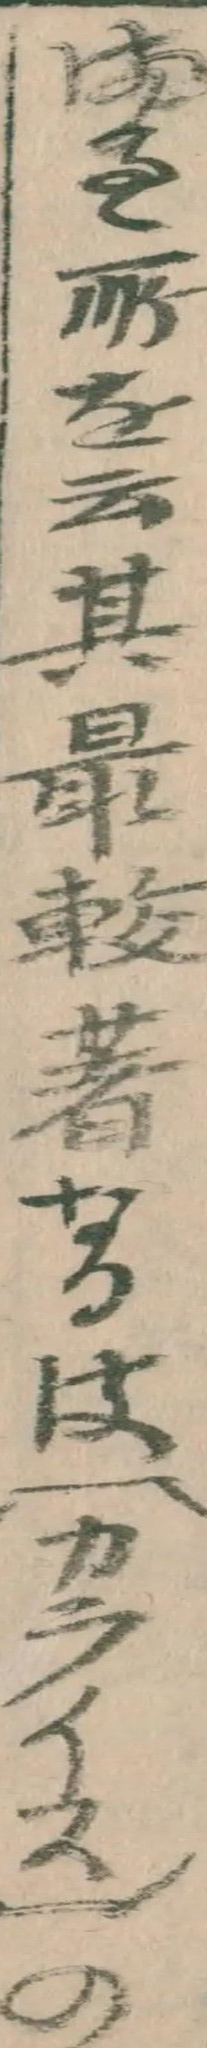まるゝ所を云其最較著なるは(カライス)の
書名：新釈輿地図説
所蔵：国立国会図書館 National Diet Library, JAPAN
